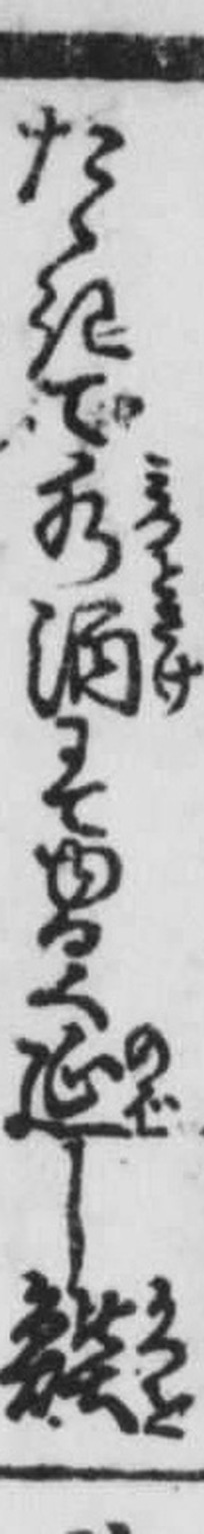たゝきで水酒にてゆるく延し鰹
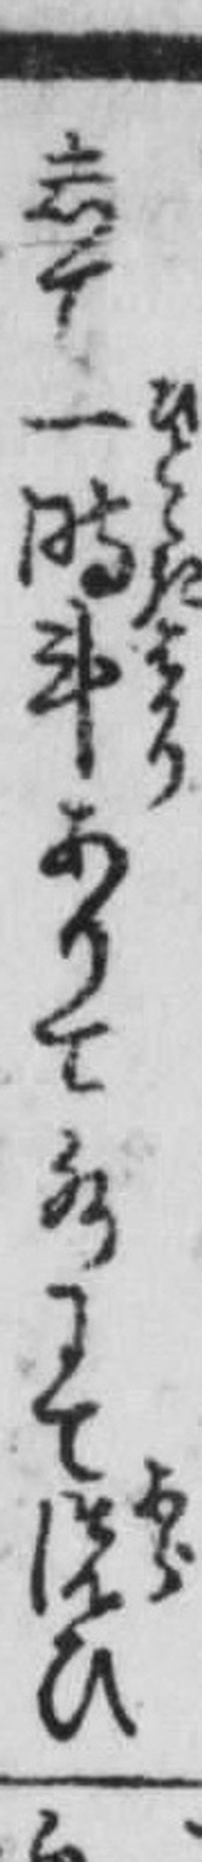して一時斗ありて水にて洗ひ
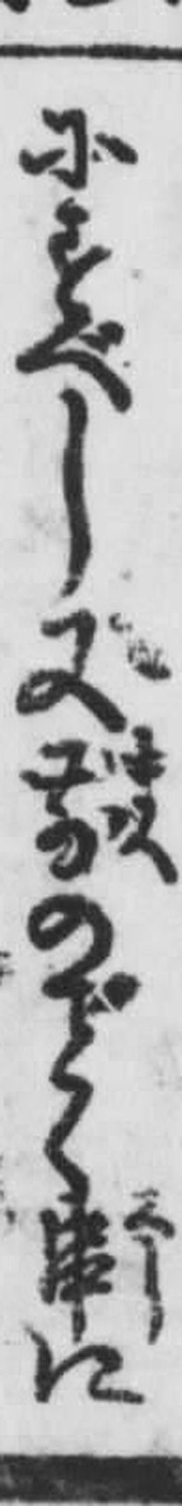にすべし又前のごとく串に
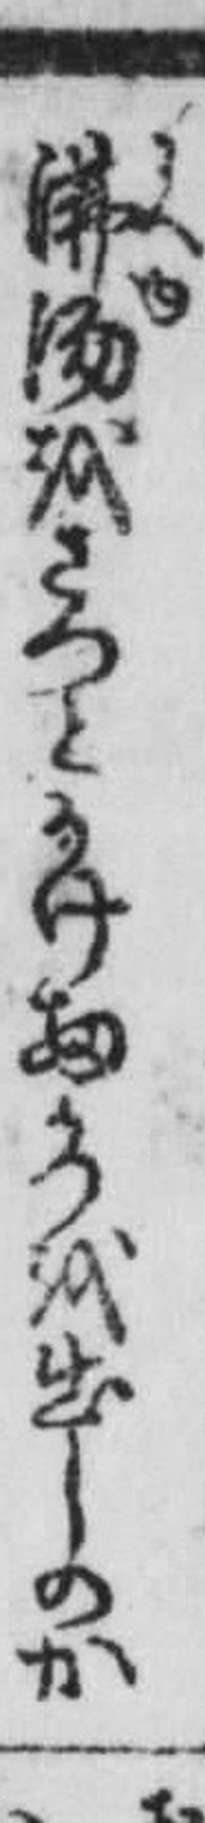沸騰をさつとかけ扨かつを出しのか
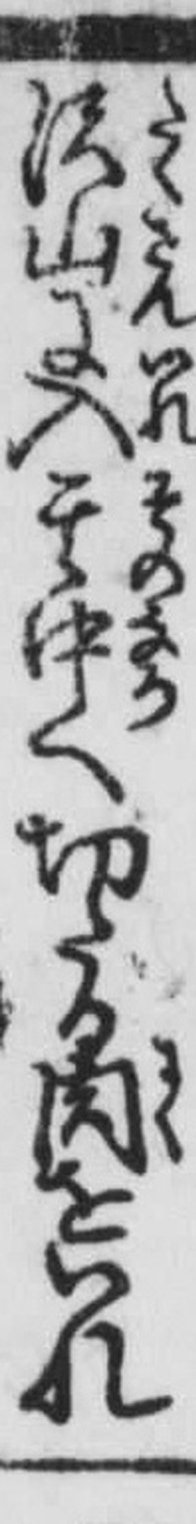沢山に入其中へ切たる肉をいれ
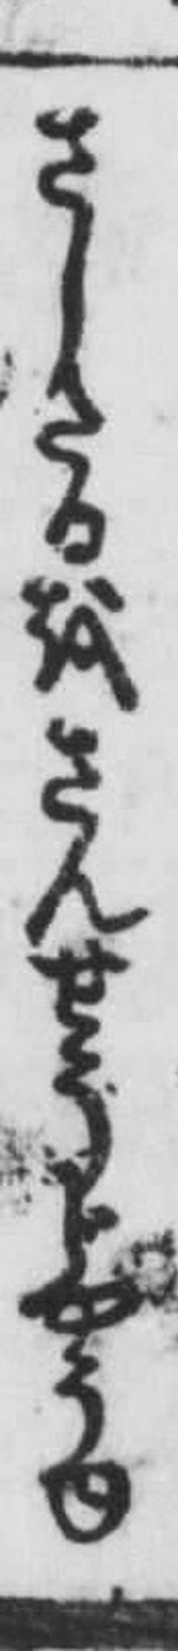さしたるをさんせうしやう
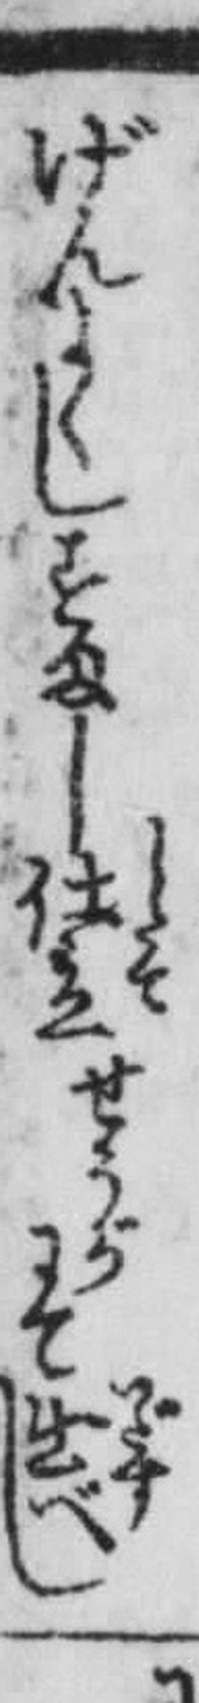げんよくしすまし仕立せうがにて出べし
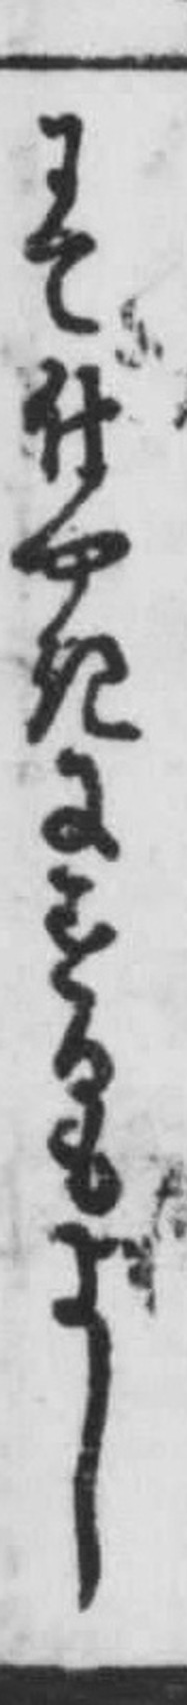にて付やきにするもよし
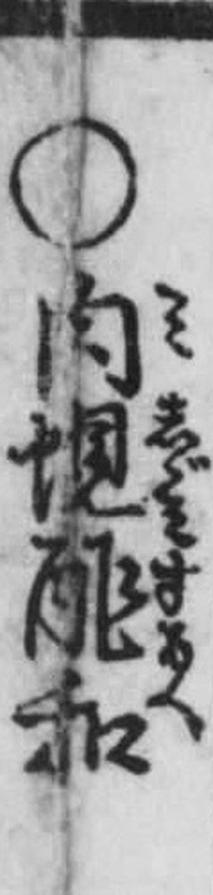○内蜆酢和
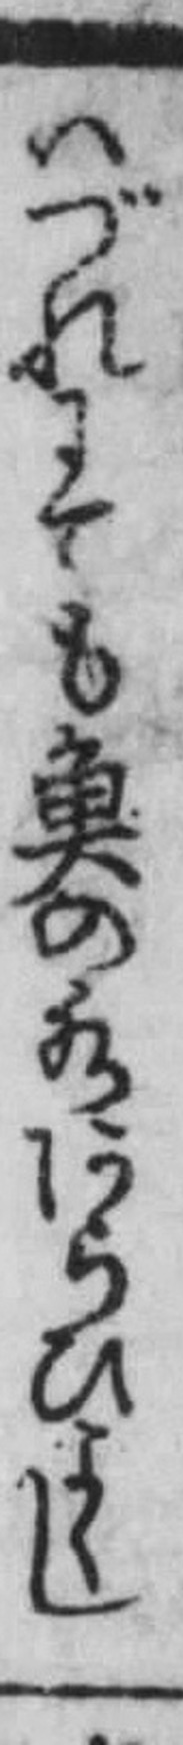いづれにても魚の水あらひよくし
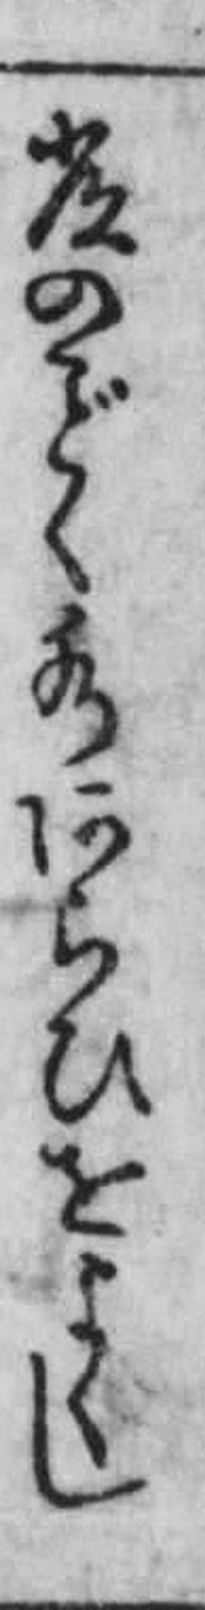常のごとく水あらひをよくし
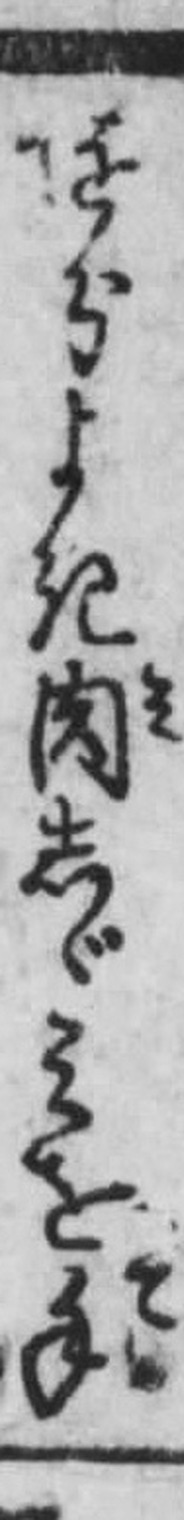随分よき肉しゞみを手
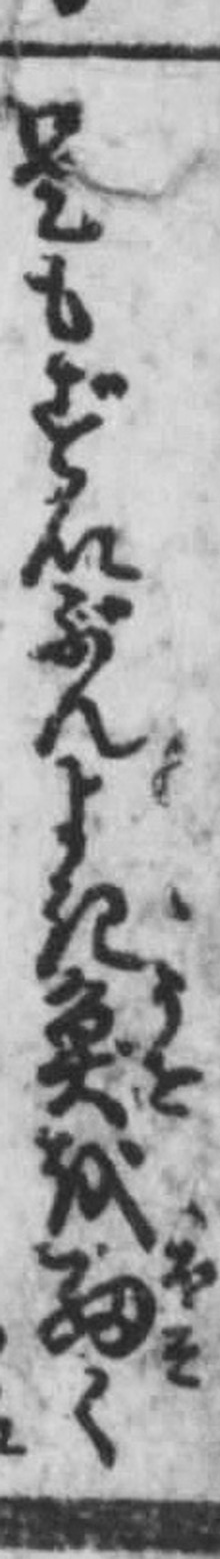是もずいぶんよき魚を細く
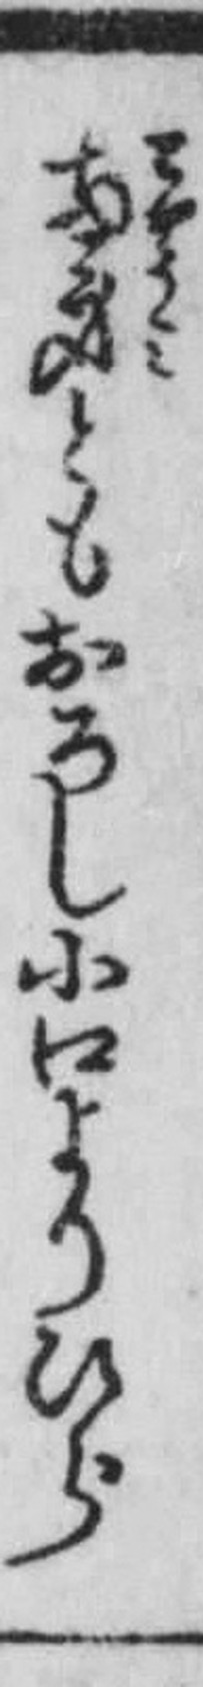両身ともおろし小口よりひら
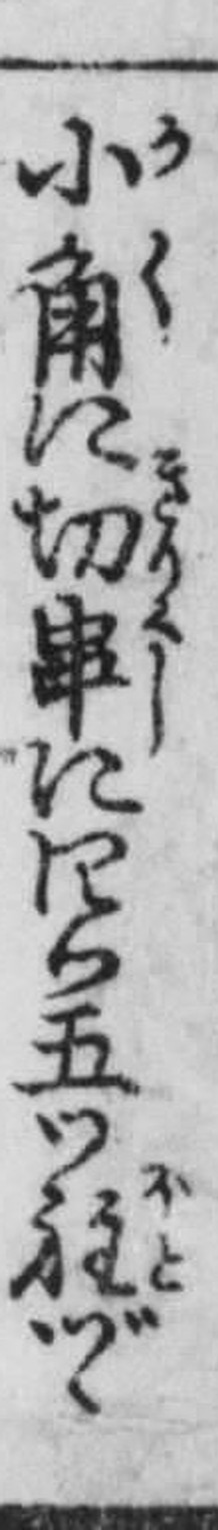小角に切串に四つ五つ程づゝ
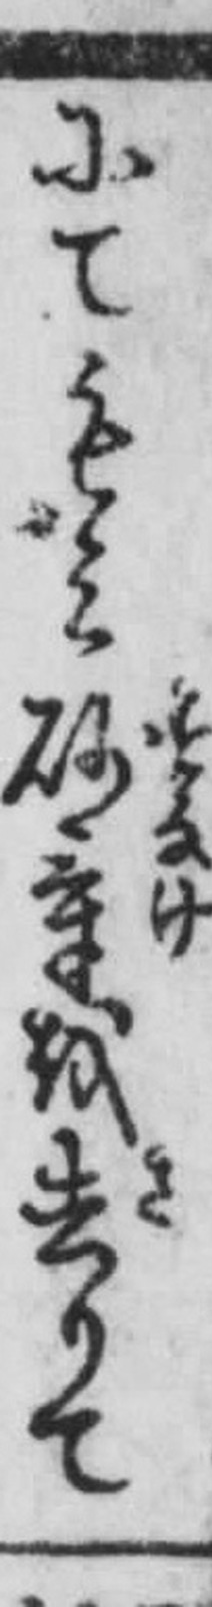にてもみ砂気を去りて
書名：精進魚類間合料理/早速庖丁
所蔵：大阪府立大学学術情報センター 国文学研究資料館
